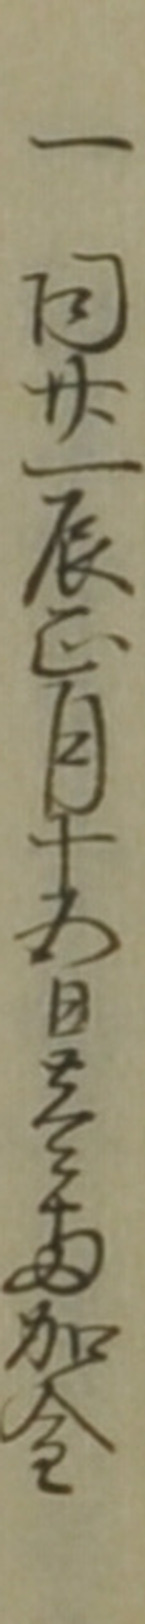一同廿一辰正月十五日壱両加金
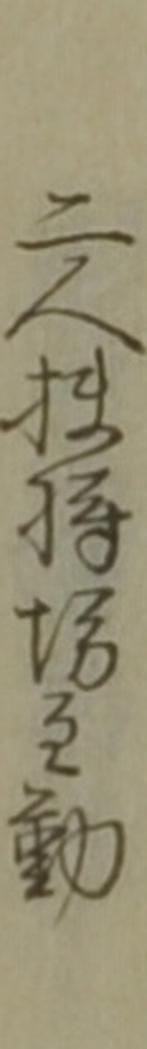二人扶持坊主勤
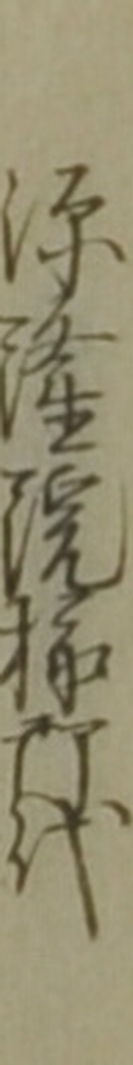源隆院様御代
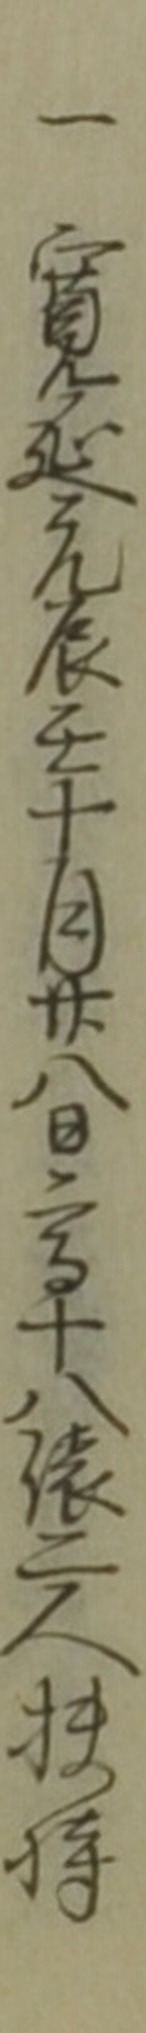一寛延元辰閏十月廿八日高十八俵二人扶持
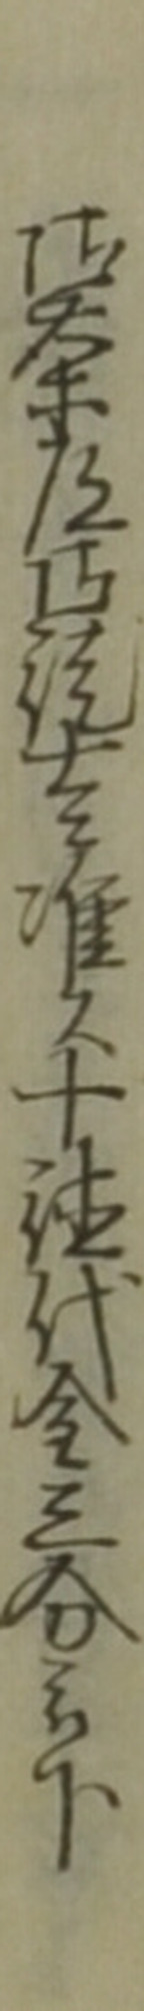御茶道御徒士ニ准ス十徳代金三分被下
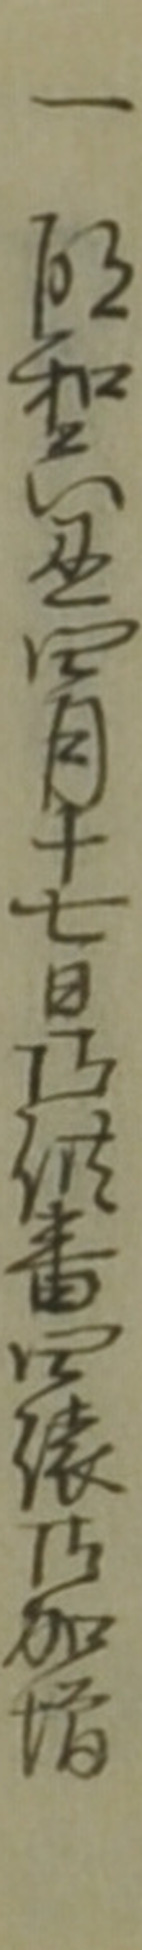一明和六丑四月十七日御供番四俵御加増
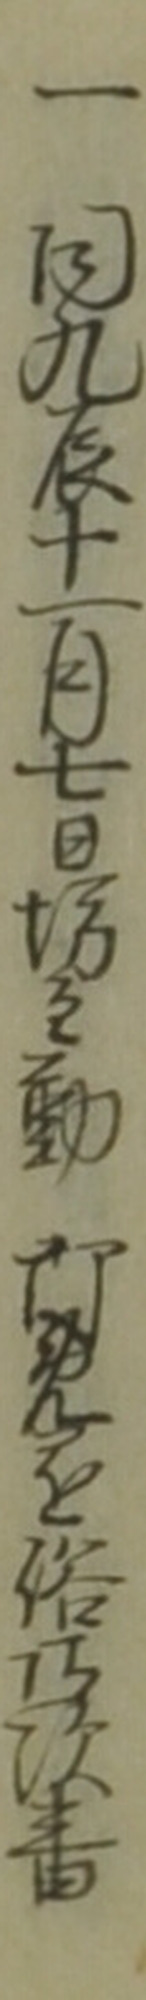一同九辰十一月七日坊主勤御免懸俗御次
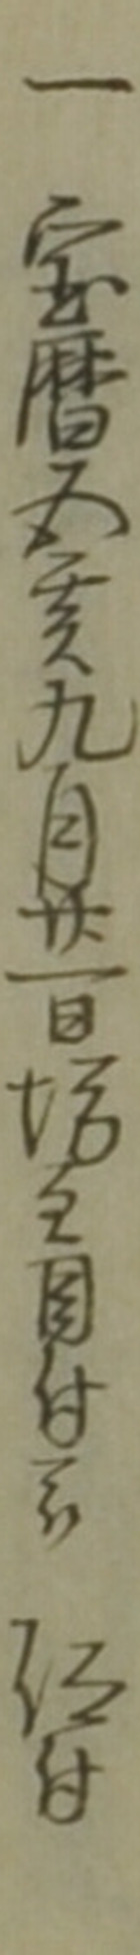一宝暦五亥九月廿一日坊主目付被仰付
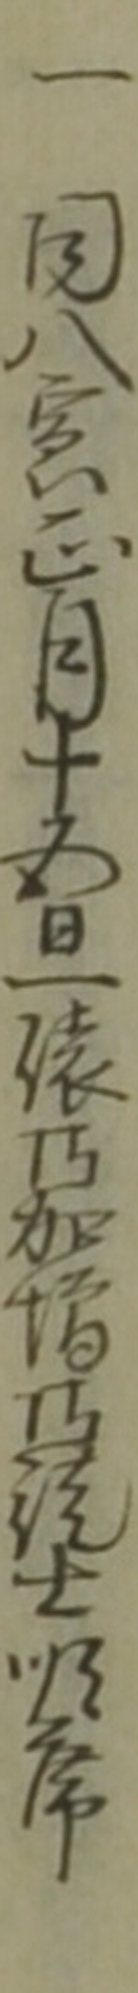一同八寅正月十五日一俵御加増御徒士順席
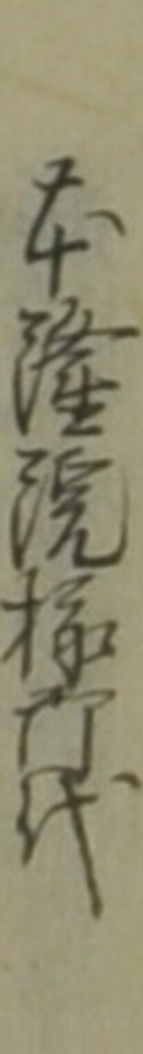本隆院様御代
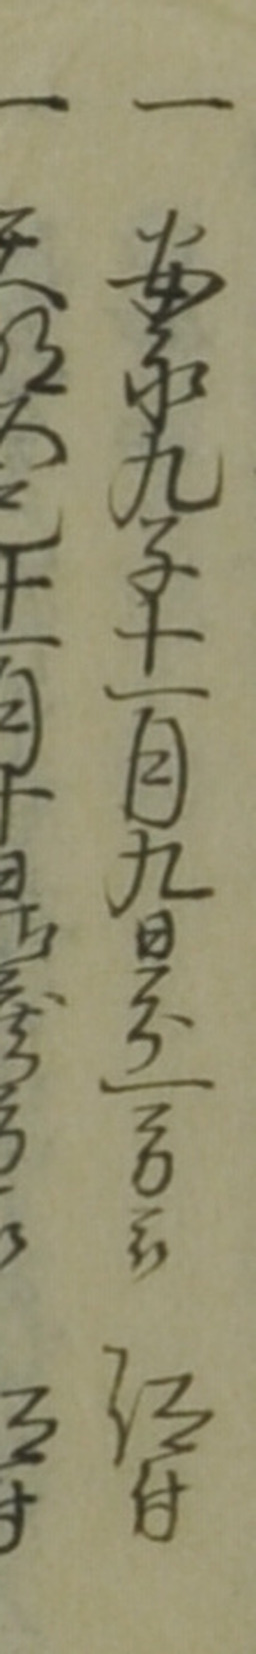一天明五巳一一月十日御蔵方被仰付
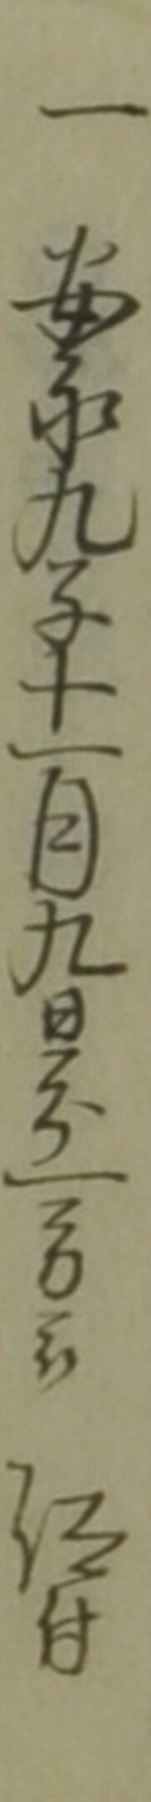一安永九子十一月九日分一方被仰付
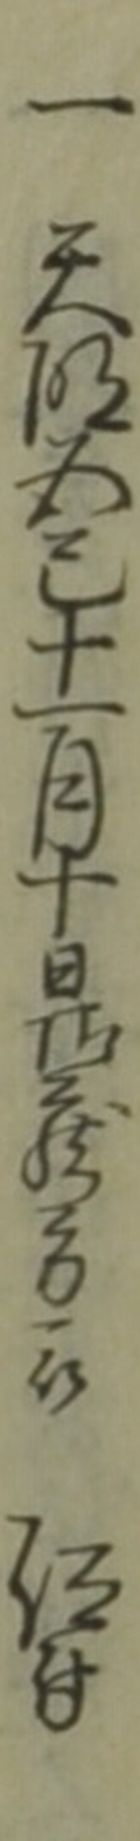一天明五巳一一月十日御蔵方被仰付
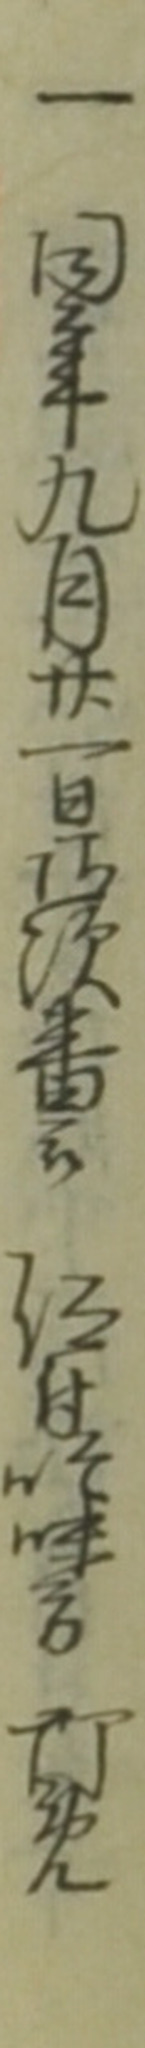一同年九月廿一日御次番被仰付吟味方御免
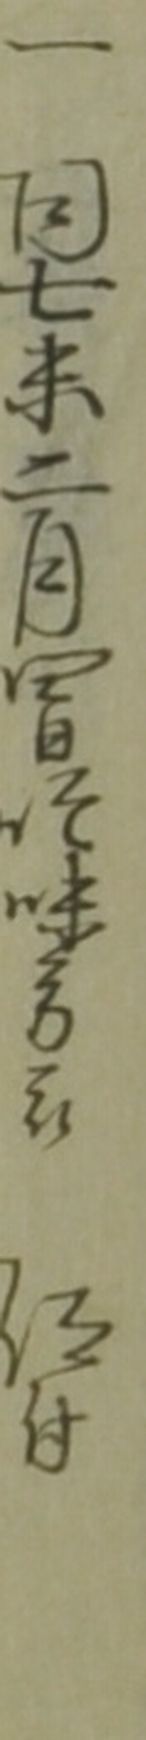一同七未二月四日吟味方被仰付
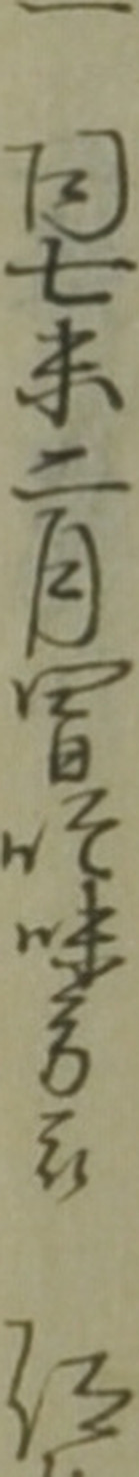一同七未二月四日吟味方被仰付
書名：無足諸士勤仕録（二）
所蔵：伊那市立高遠町図書館・合同会社AMANE
